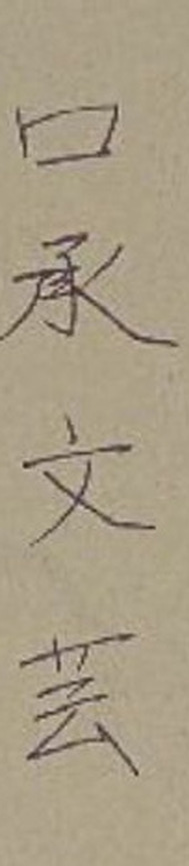口承文芸
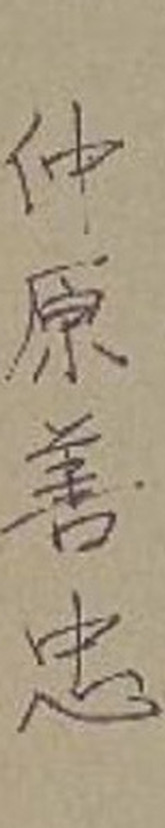仲原善忠

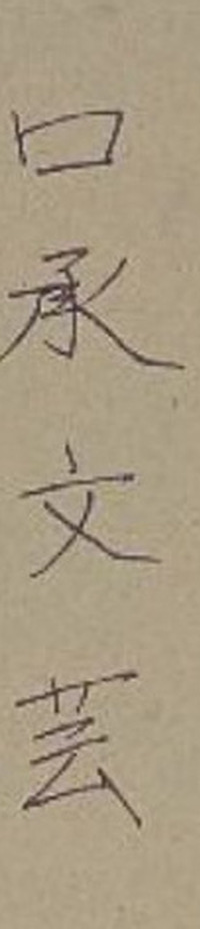口承文芸
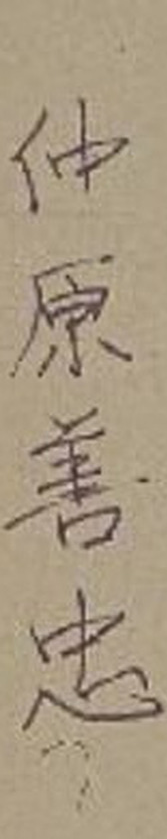仲原善忠

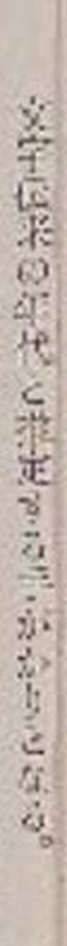文字伝来の年代を推定する手がかりとなる。
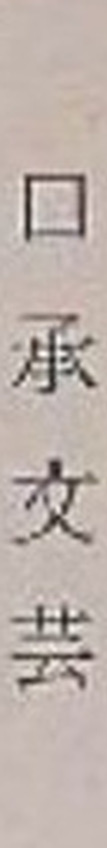口承文芸
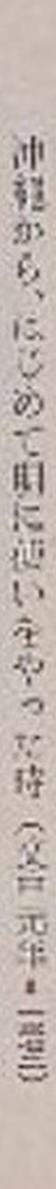沖縄から、はじめて明に使いをやった時(文中元年＝一三七二)
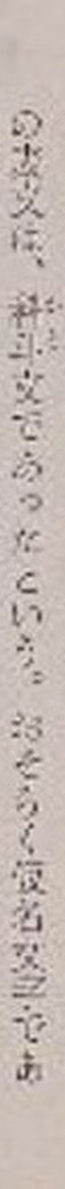の表文は、科斗文であったという。おそらく仮名文字であ
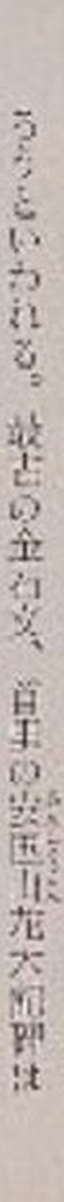ろうといわれる。最古の金石文、首里の安国山花木記碑は
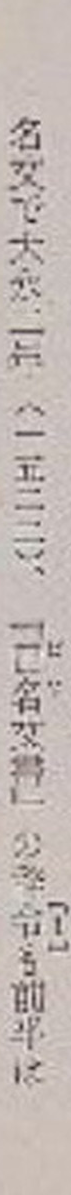名文で大永二年(一五二二)、『田名文書』の発令も前半は
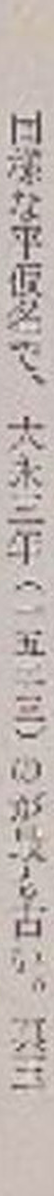同様な平仮名で、大永三年(一五二三)のが最も古い。真玉
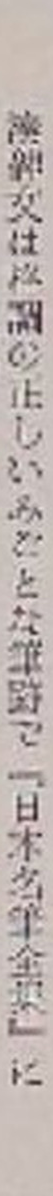湊碑文は格調の正しいみごとな筆跡で『日本名筆全集』に
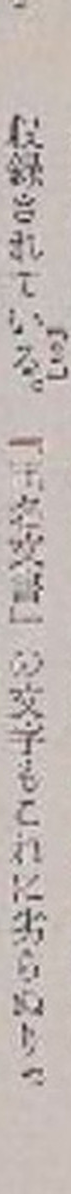収録されている。『田名文書』の文字もこれに劣らぬりっ
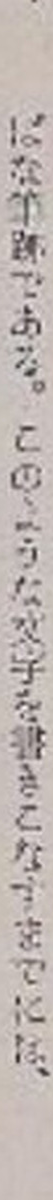ぱな筆跡である。このような文字を書きこなすまでには、
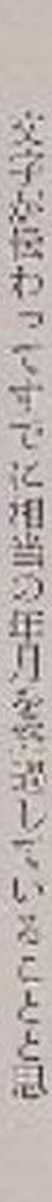文字が伝わってすでに相当の年月を経過していることと思
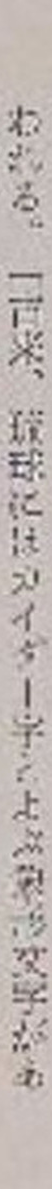われる。「古来、琉球にはカイダー字とよぶ象形文字があ
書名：沖縄口承文芸
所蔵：University of the Ryukyus Library
